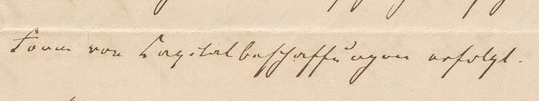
Form von Capitalbeschaffungen erfolgt.
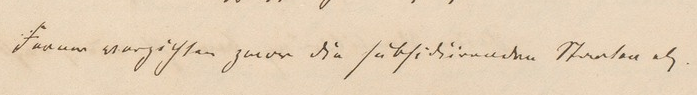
Ferner verzichten zwar die subsidirenden Staaten etc.
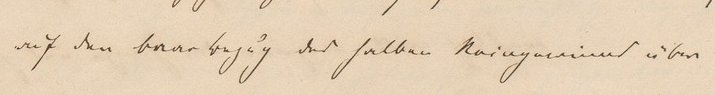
auf den baar Bezug des halben Reingewinns über
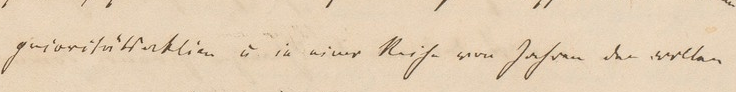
prioritätsaktien u in einer Reihe von Jahren den vollen
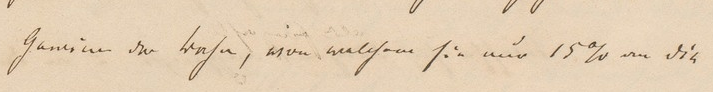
Gewinn der Bahn, von welchem sie nur 15% an die
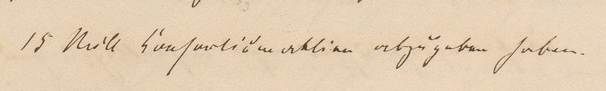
15 Mill Consortiumaktien abzugeben haben.
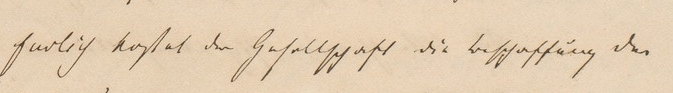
Endlich kostet der Gesellschaft die Beschaffung der
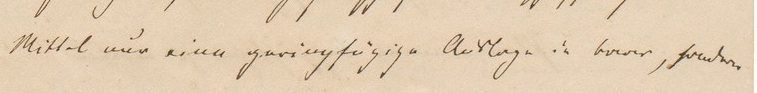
Mittel nur eine geringfügige Auslage in baar, sondern
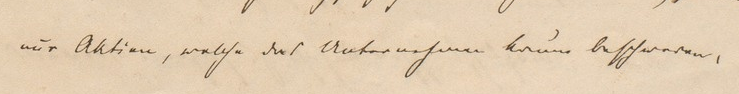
nur Aktien, welche das Unternehmen kaum beschweren.
